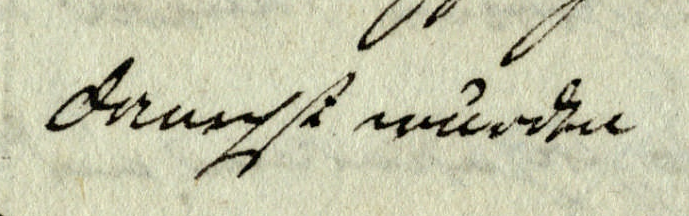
Danechst wurden
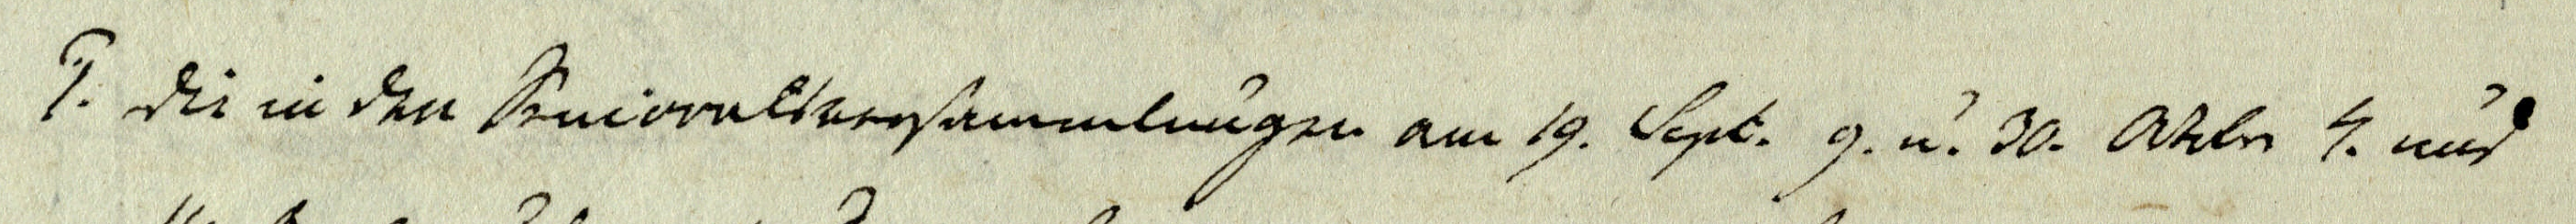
1. die in den Senioratsversammlungen am 19. Sept. 9. u. 30. Octbr. 4. und
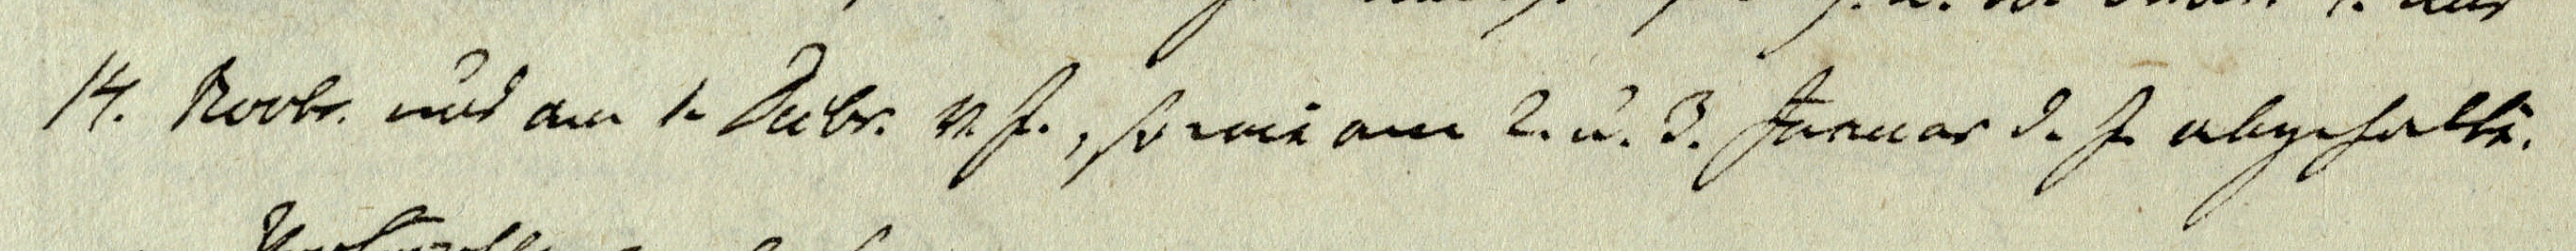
14. Novbr. und am 1. Decbr. v. J., so wie am 2. u. 3. Januar d. J. abgehalte¬
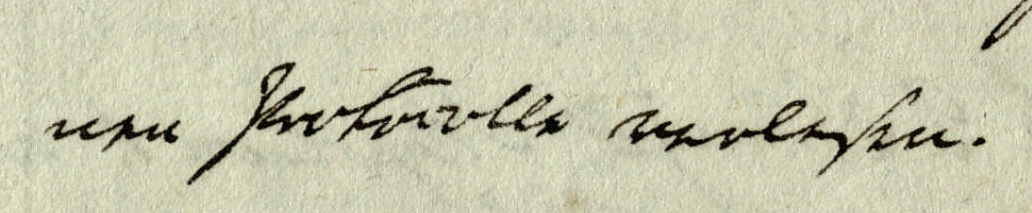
nen Protocolle verlesen.
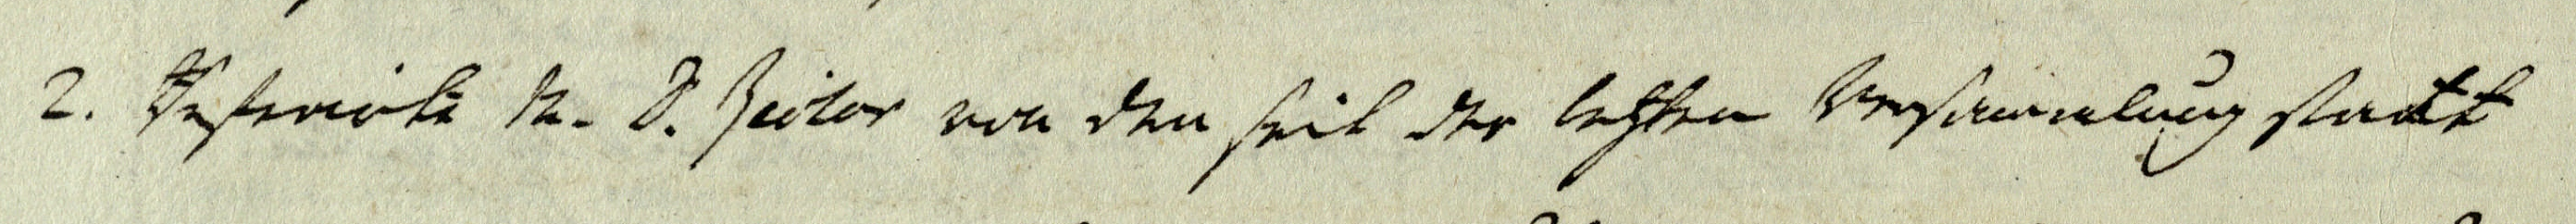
2. Referirte M. D. Rector von den seit der letzten Versammlung statt
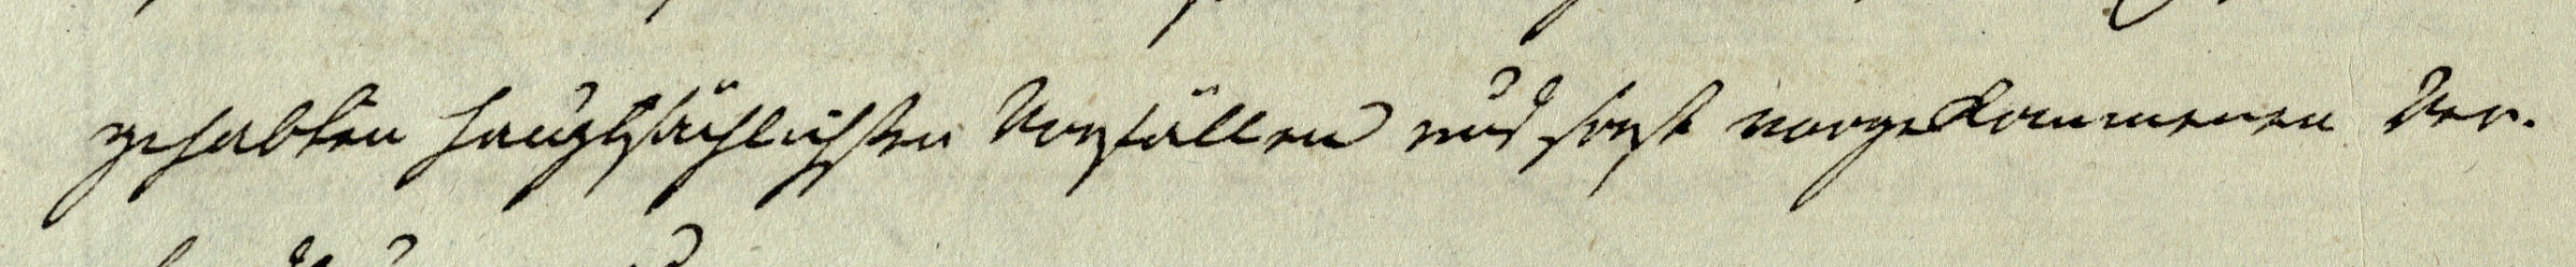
gehabten hauptsächlichen Vorfällen und sonst vorgekommenen Ver¬
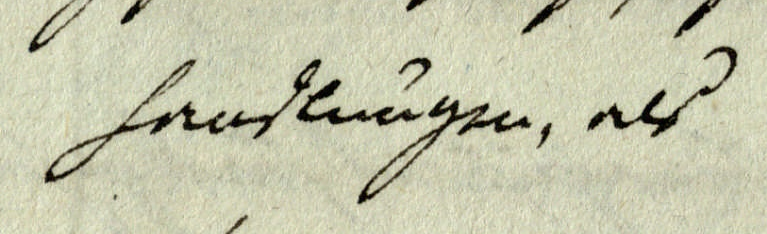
handlungen, als
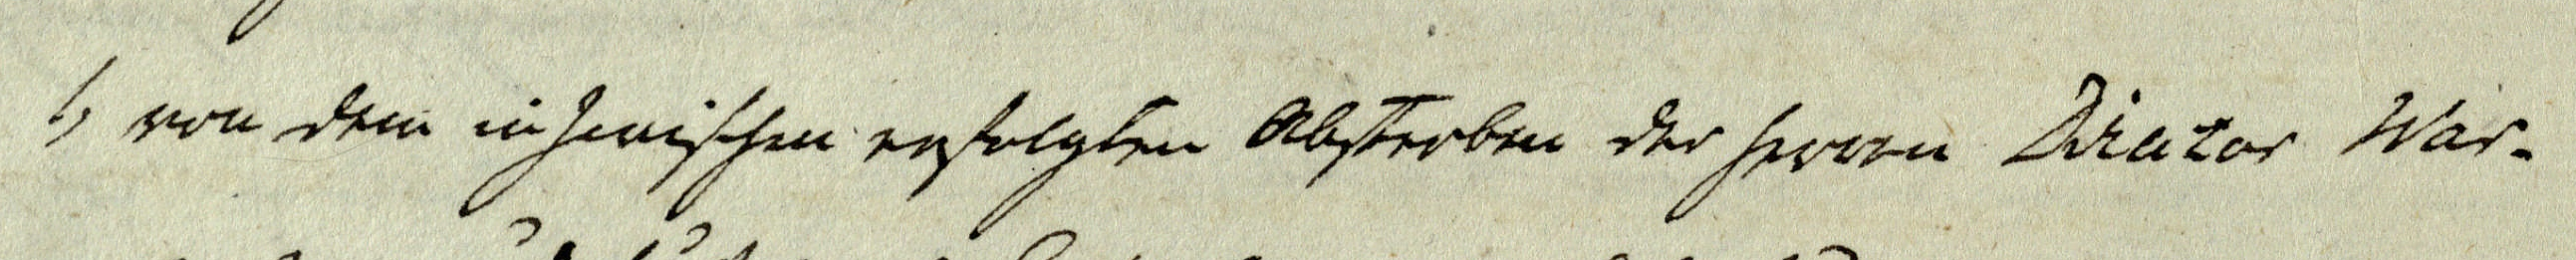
1, von dem inzwischen erfolgten Absterben der Herren Director War¬
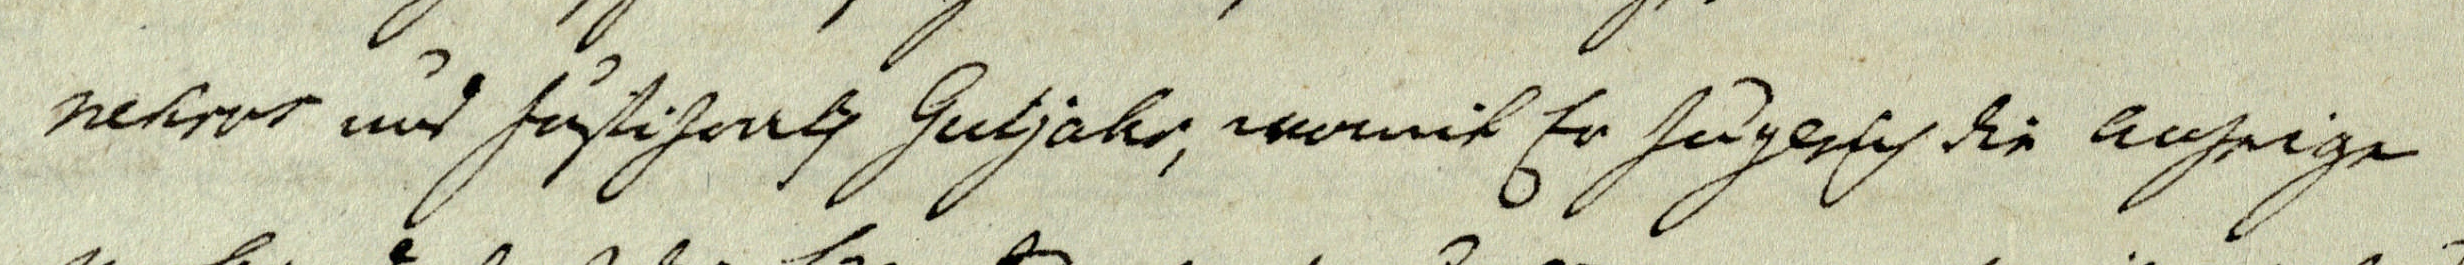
nekros und Justizrath Gutjahr, womit Er zugleich die Anzeige
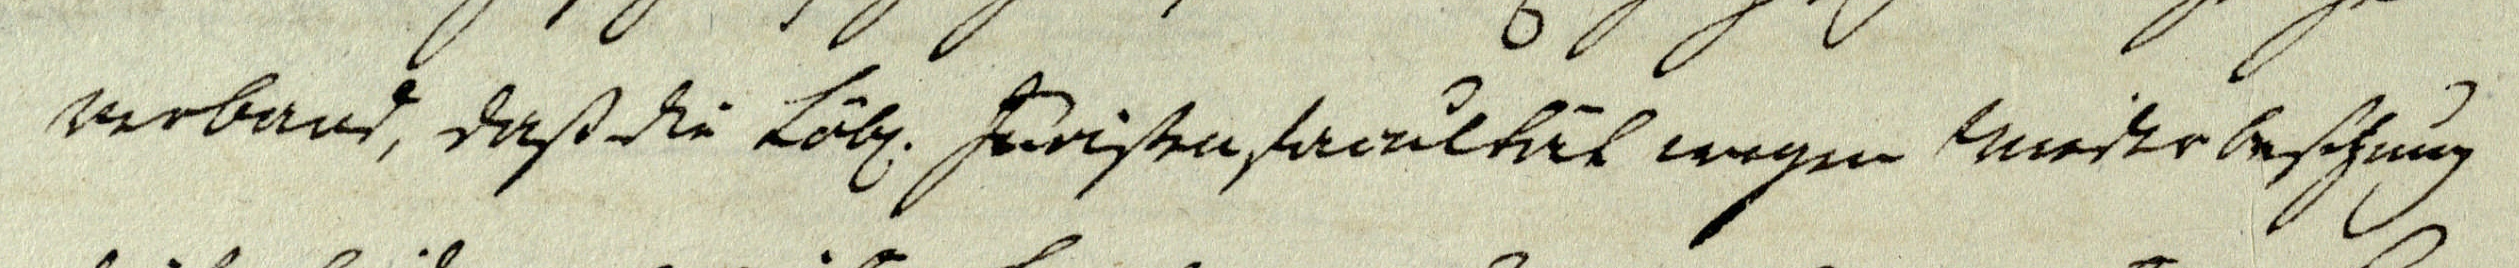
verband, daß die Löbl. Juristenfacultät wegen Wiederbesetzung
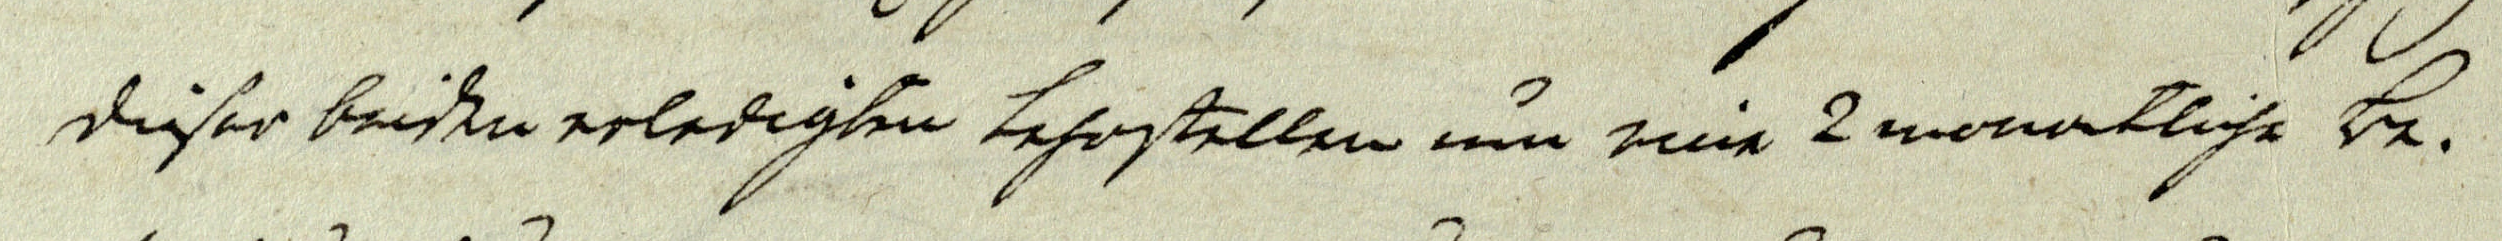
dieser beiden erledigten Lehrstellen um eine 2 monatliche Be¬
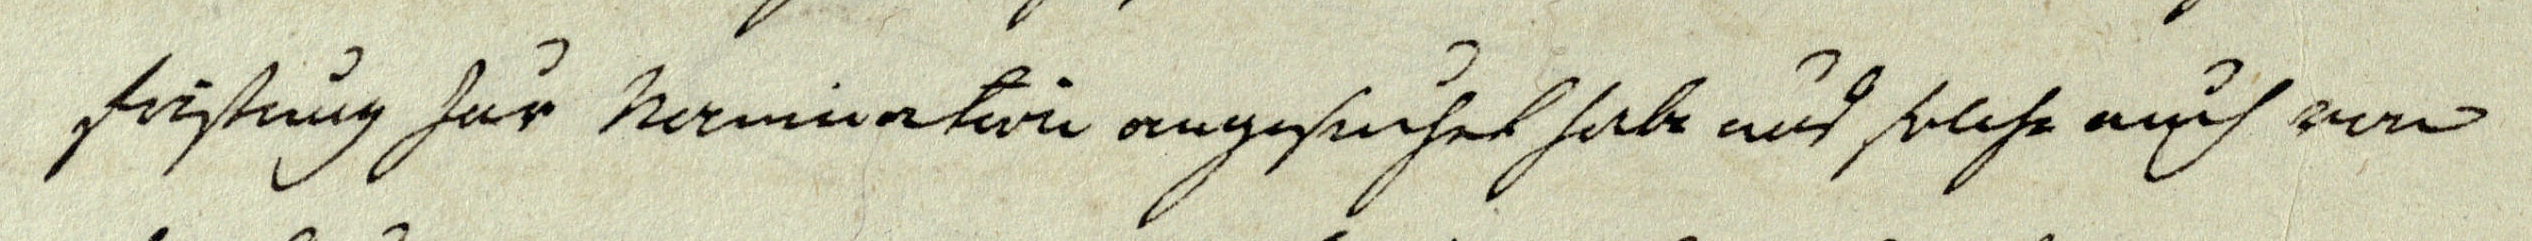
fristung zur Nomination angesuchet habe und solche auch von
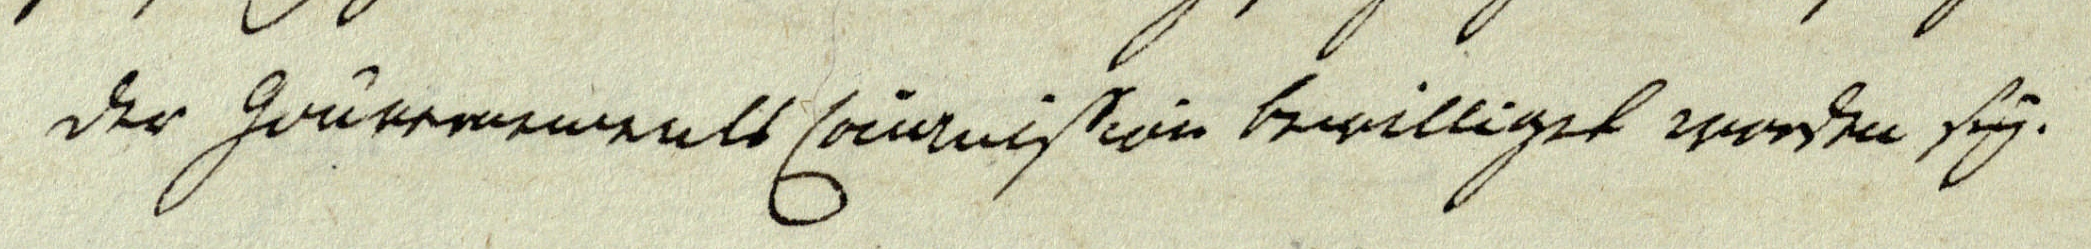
der Gouvernements Commission bewilliget worden seÿ.
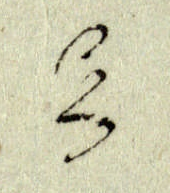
2,
